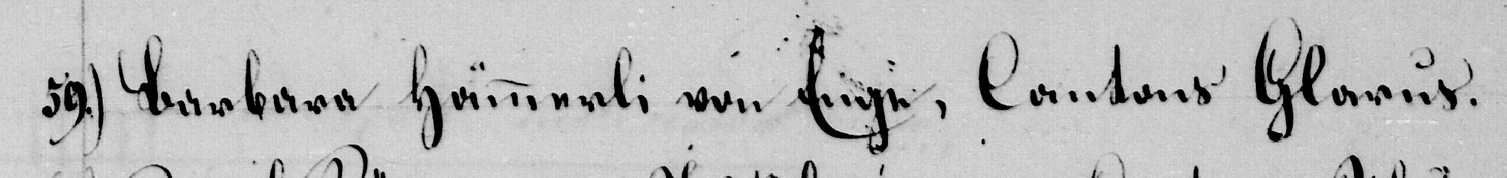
59.) Barbara Hämmerli von Enge, Cantons Glarus.
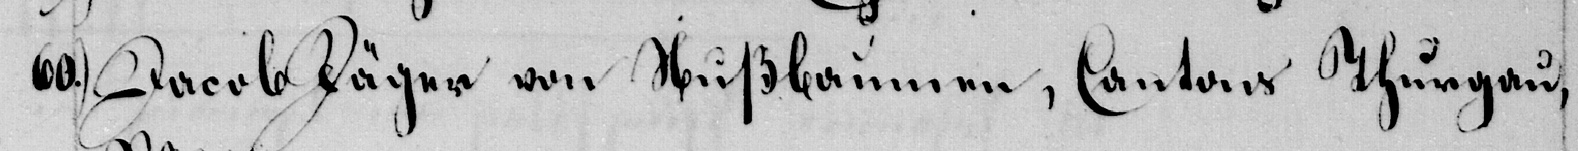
60.) Jacob Jäger von Nußbaumen, Cantons Thurgau,
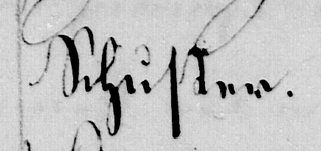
Schuster.
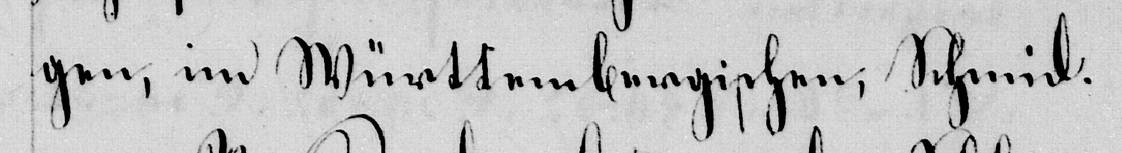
gen, im Württembergischen, Schmid.
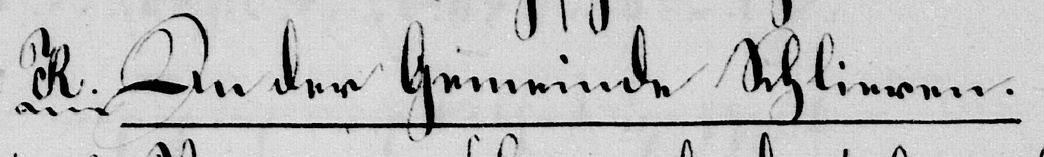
K. In der Gemeinde Schlieren.
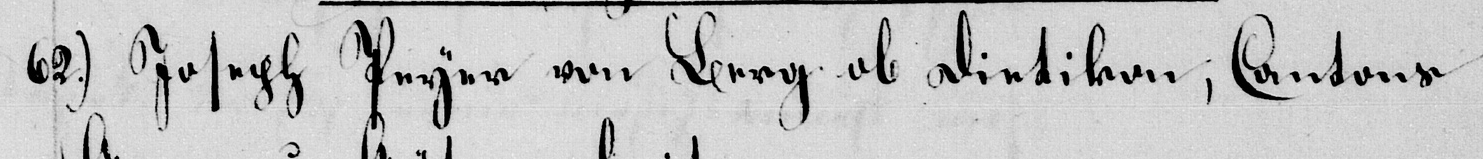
62.) Joseph Peyer von Berg ob Dietikon, Cantons
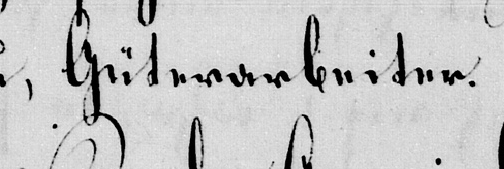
Güterarbeiter.
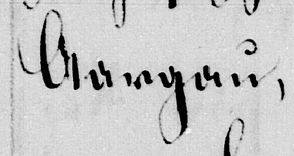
Aargau,
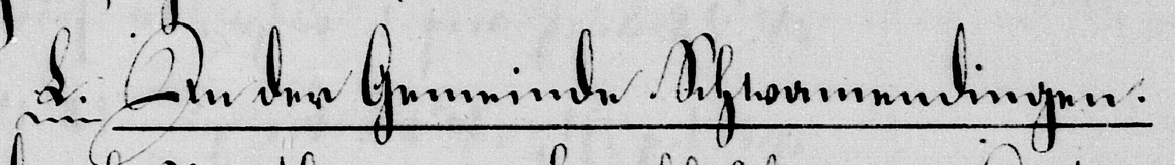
L. In der Gemeinde Schwamendingen.
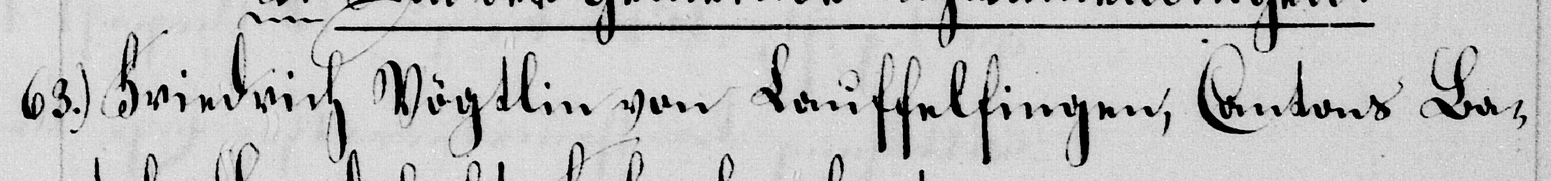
63.) Friedrich Vögtlin von Lauffelfingen, Cantons Ba¬
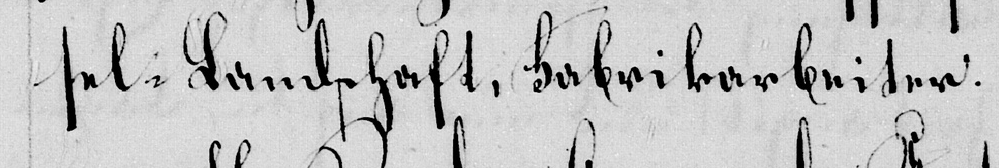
sel-Landschaft, Fabrikarbeiter.
